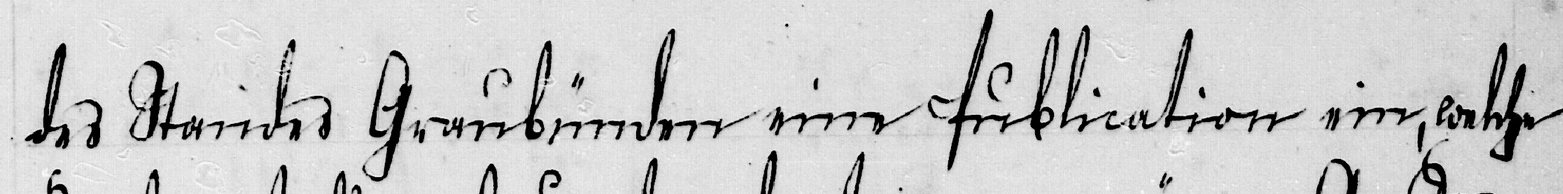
des Standes Graubünden eine Publication ein, welche
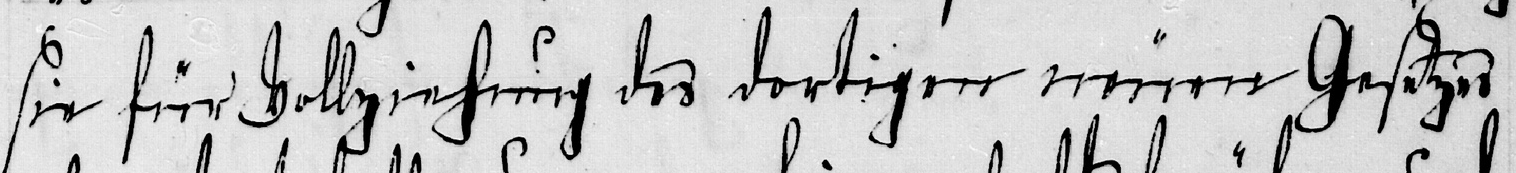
sie für Vollziehung des dortigen neuen Gesetzes
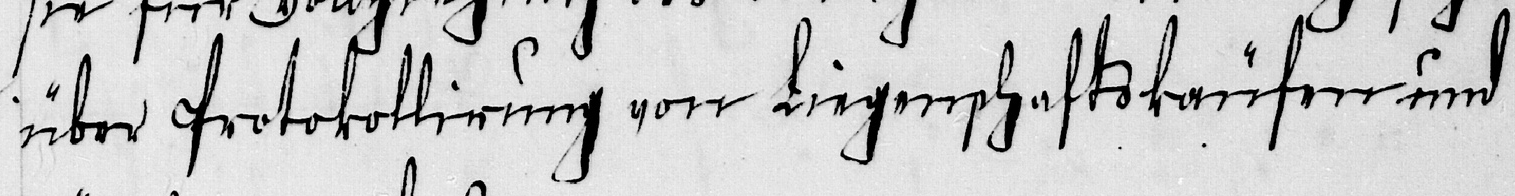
über Protokollirung von Liegenschaftskäufen und
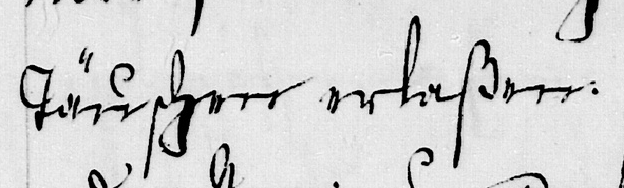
Täuschen erlaßen:
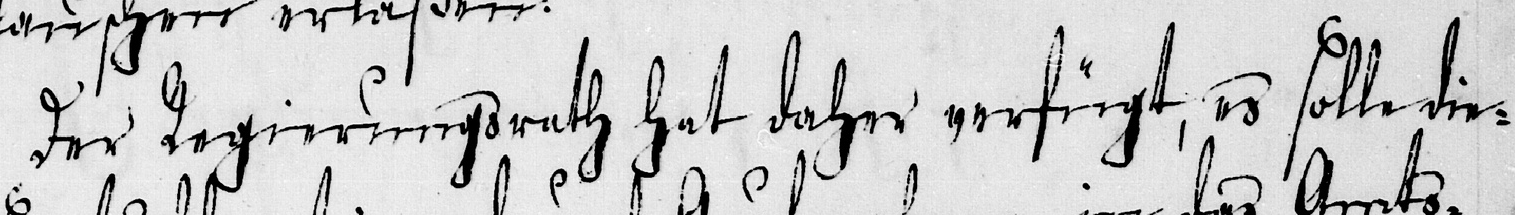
Der Regierungsrath hat daher verfügt, es solle di¬
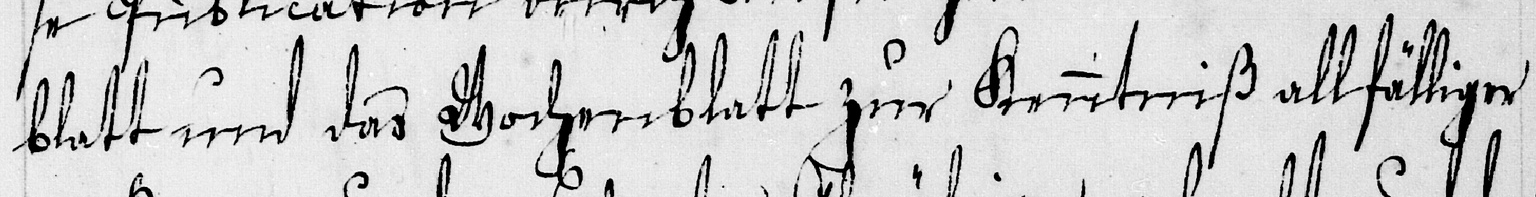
blatt und das Wochenblatt zur Kenntniß allfälliger
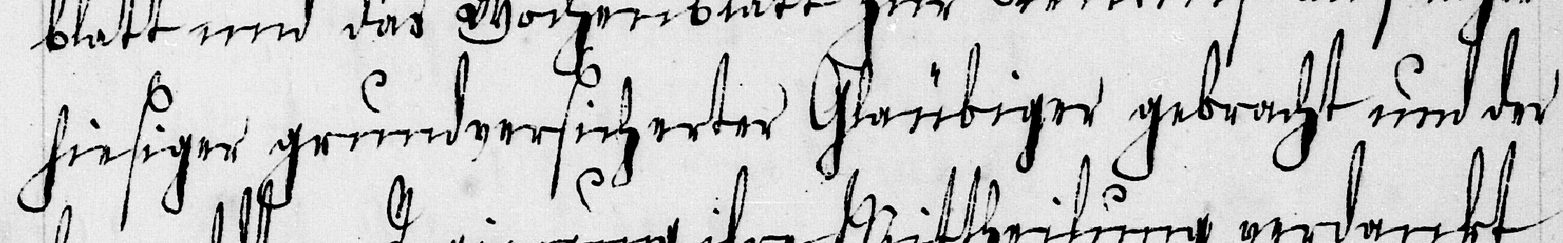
hiesiger grundversicherter Gläubiger gebracht und der
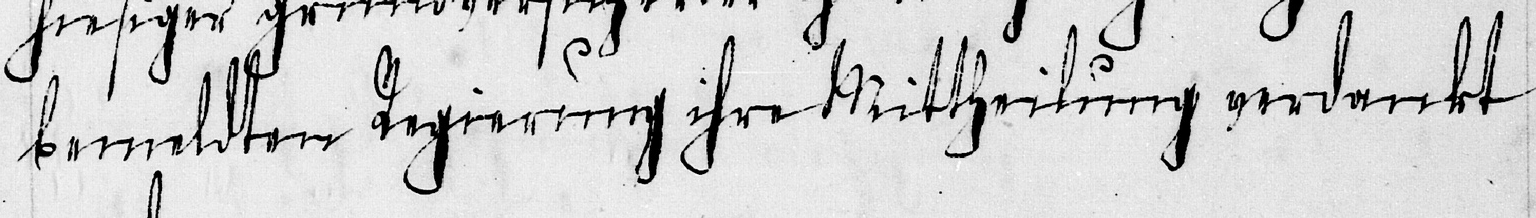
bemeldten Regierung ihre Mittheilung verdankt
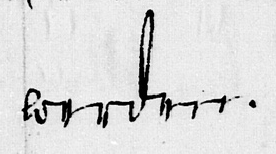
werden.
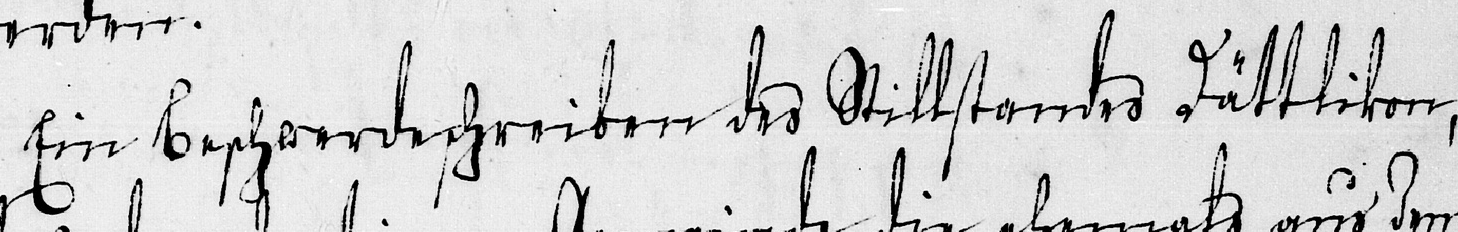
Ein Beschwerdeschreiben des Stillstandes Dättlikon,
